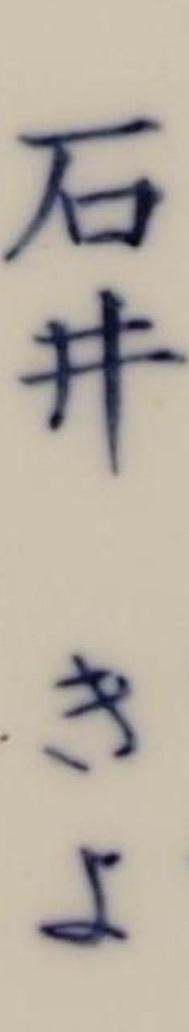石井きよ
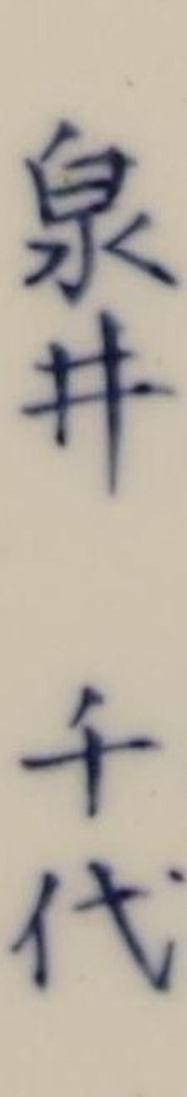泉井千代
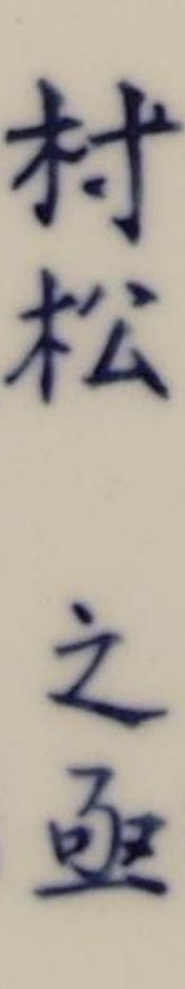村松之丞
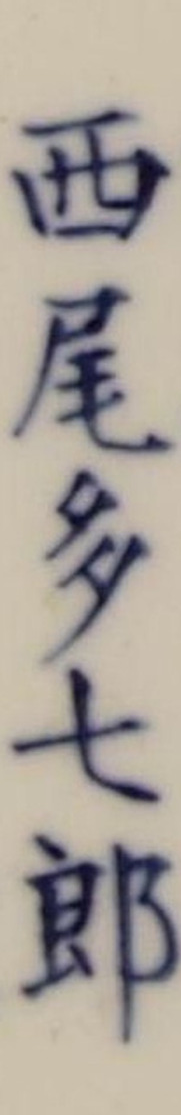西尾多七郎
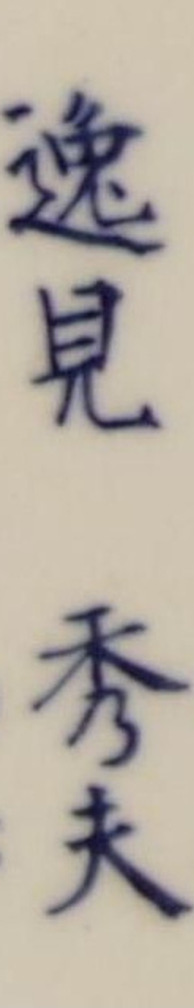逸見秀夫
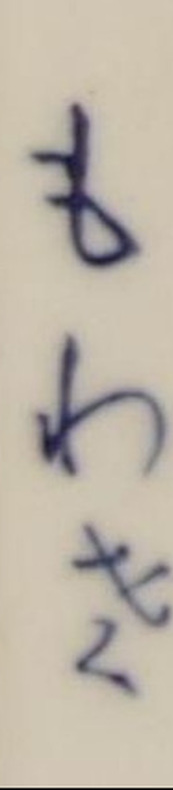もわさ

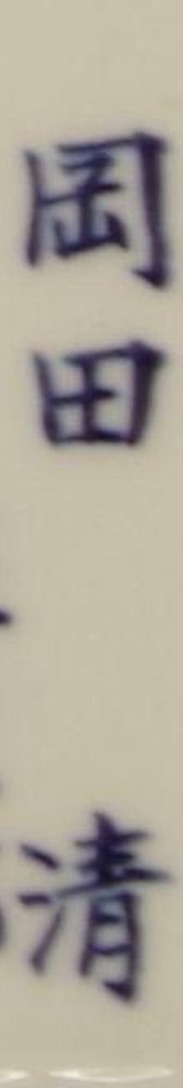岡田清
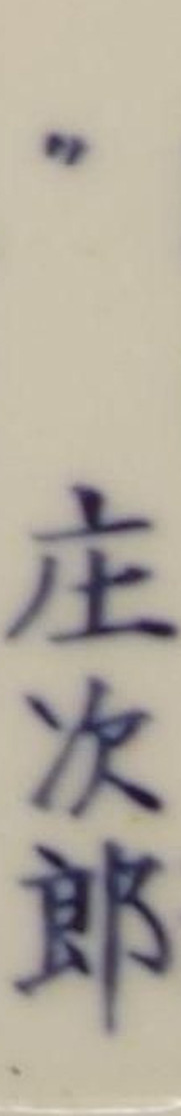庄次郎
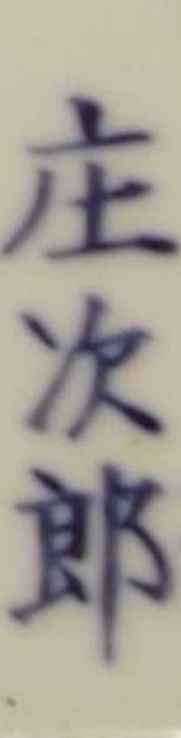庄次郎
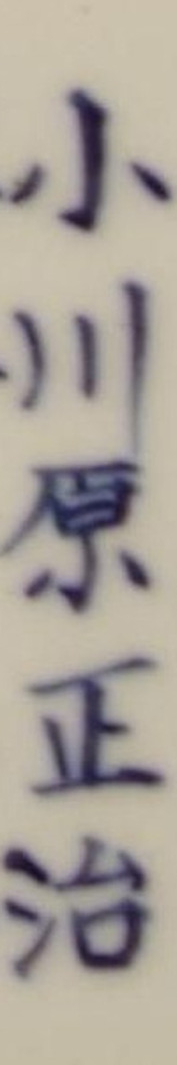小川原正治
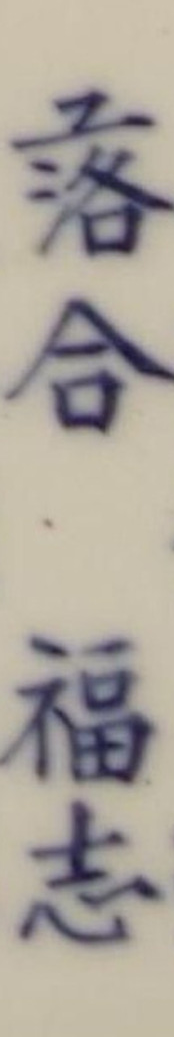落合福志
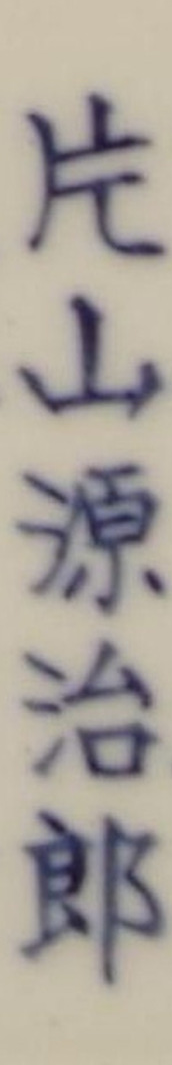片山源治郎
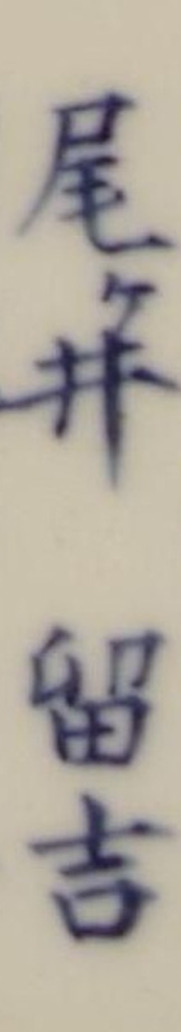尾ヶ井留吉
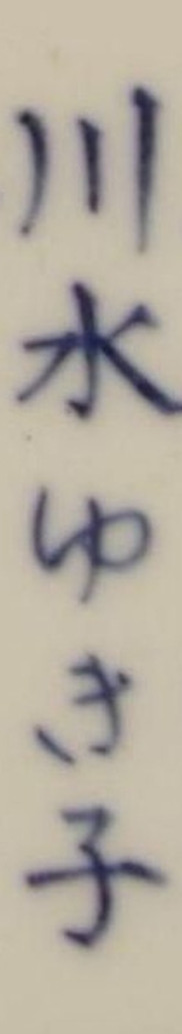川水ゆき子
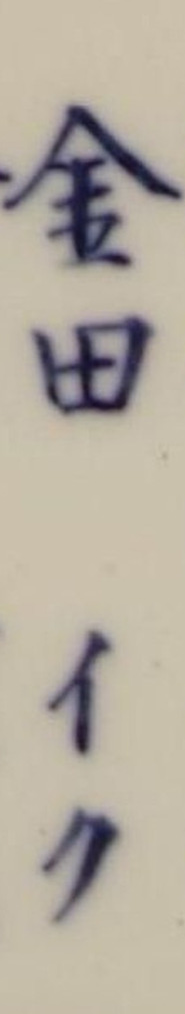金田イク
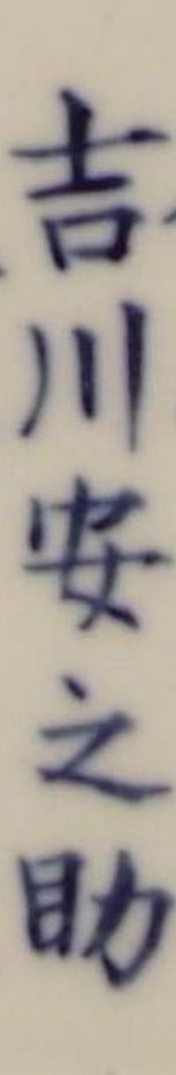吉川安之助
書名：E~L
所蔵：高野山金剛峯寺
